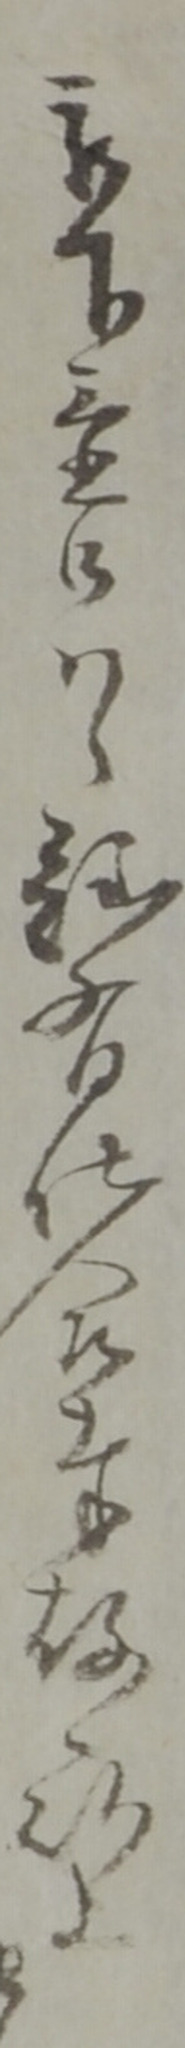被下置候ハヽ難有仕合奉存候以上
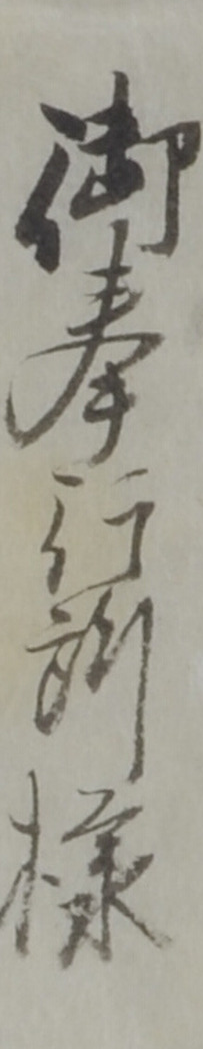御奉行所様
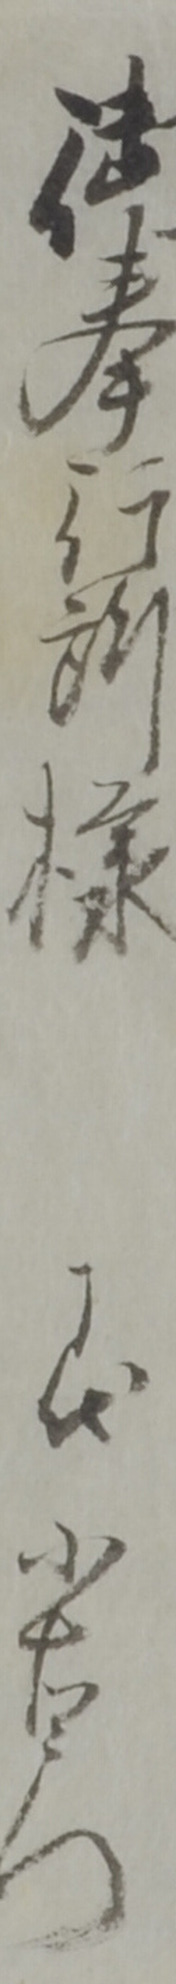御奉行所様丁代小右衛門
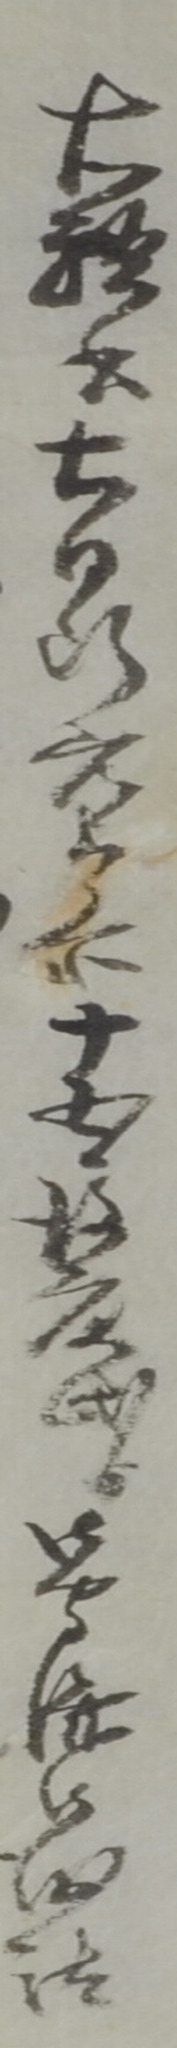右願書右同断差上候所十五日後藤氏ゟ御聞済御渡御沙汰
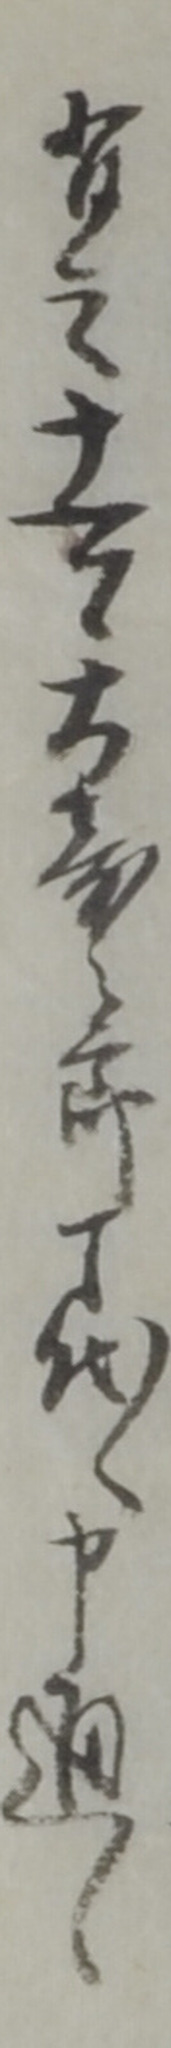有候之十六日大寄之節丁代へ申通候

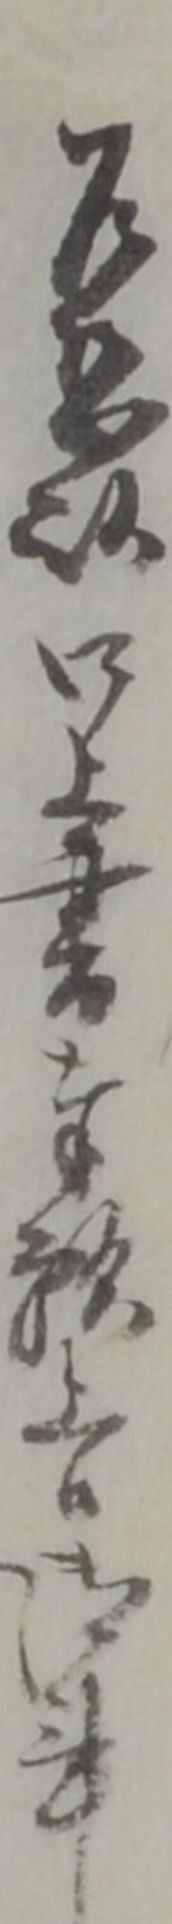乍恐以口上書奉願上候御事
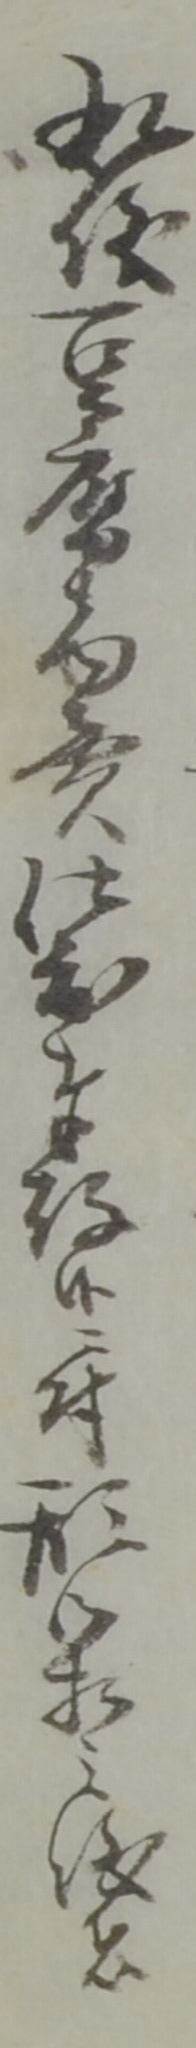私儀豆腐商売仕度奉存候ニ付形箱之儀者
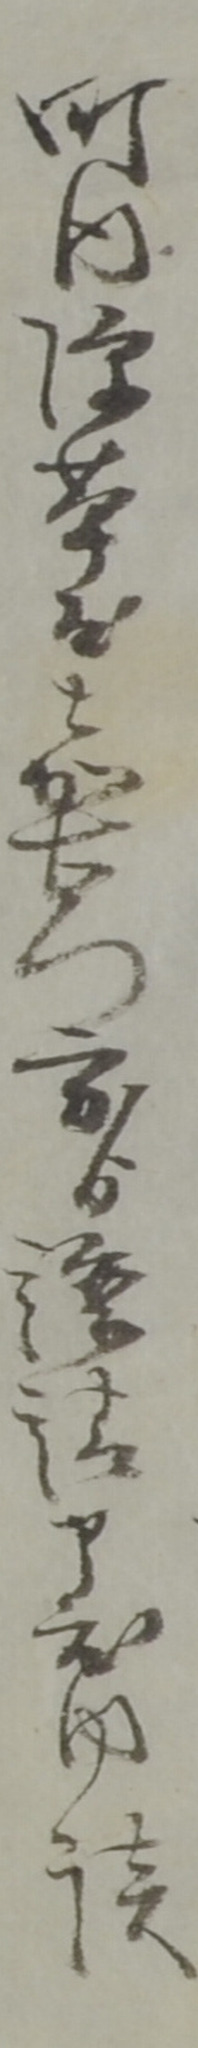町内深草屋嘉右衛門方より譲請申度内談
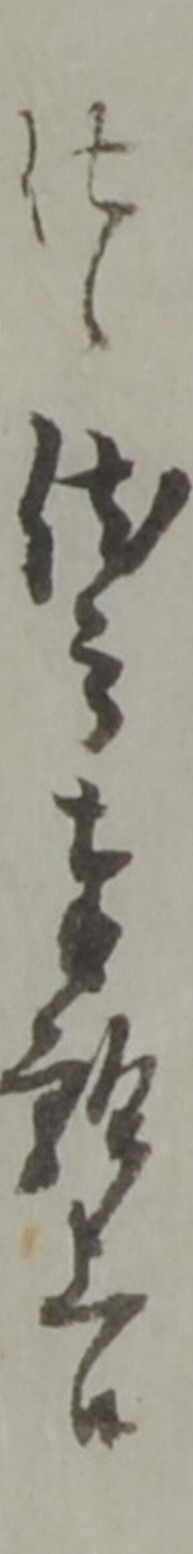仕候依之奉願上候
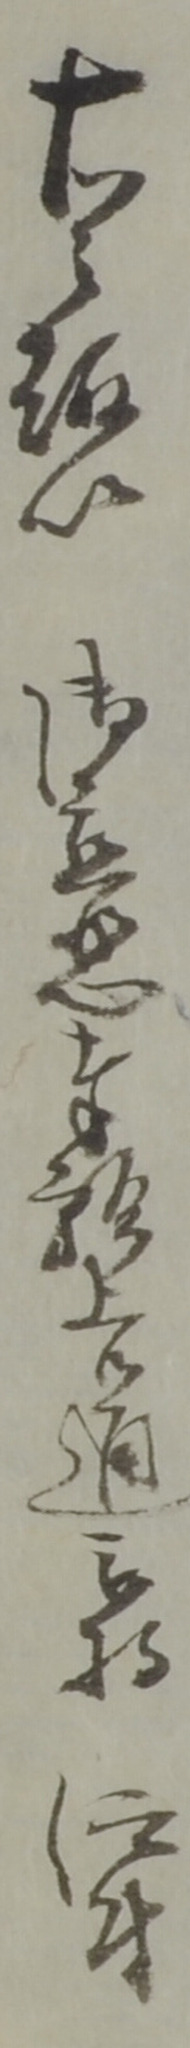右之趣以御慈悲奉願上候通被為仰付
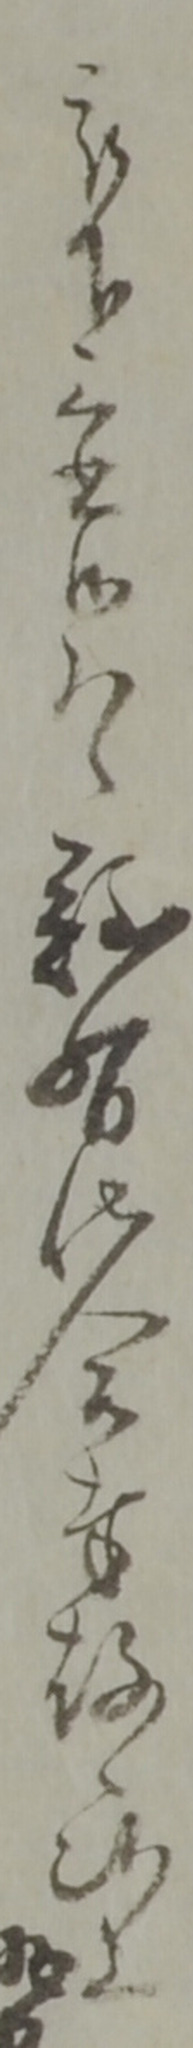被下置候ハヽ難有仕合奉存候以上
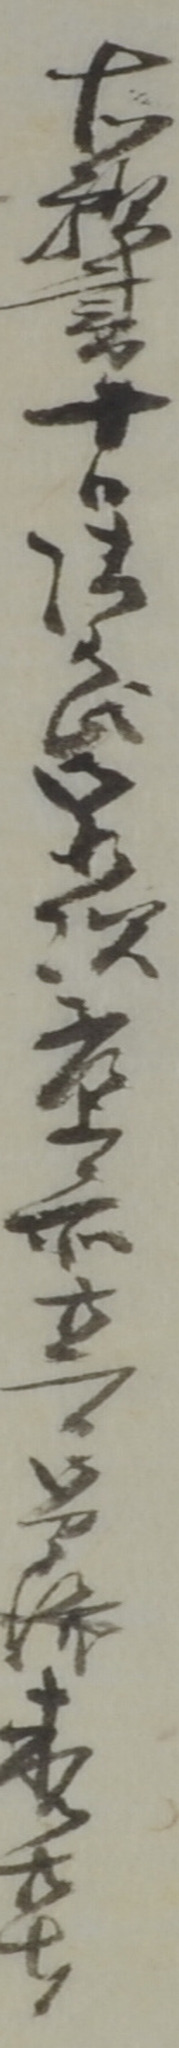右願書十日清水氏御取次差上候所廿二日御聞済来ル廿七日
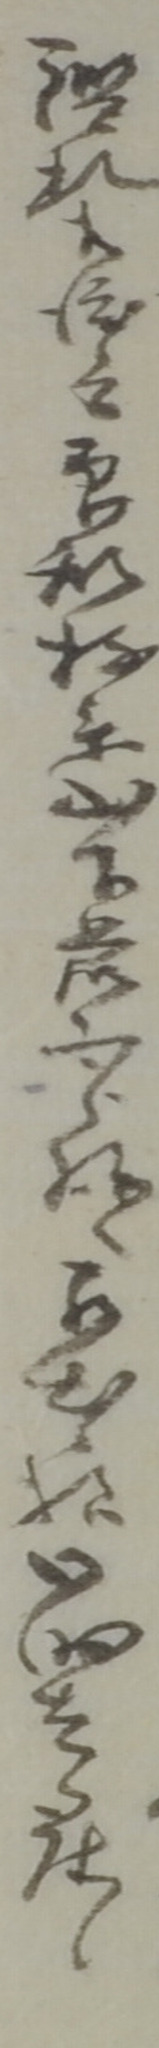鑑札相渡候ハヽ印形持参山下虎五郎様へ召出候様御沙太御座候
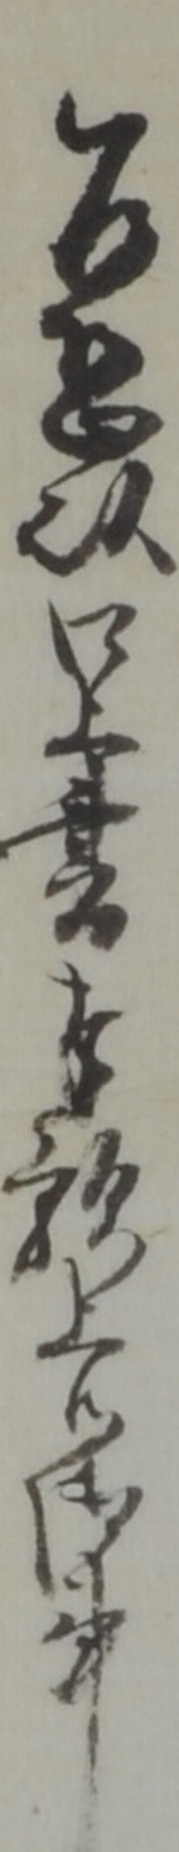乍恐以口上書奉願上候御事
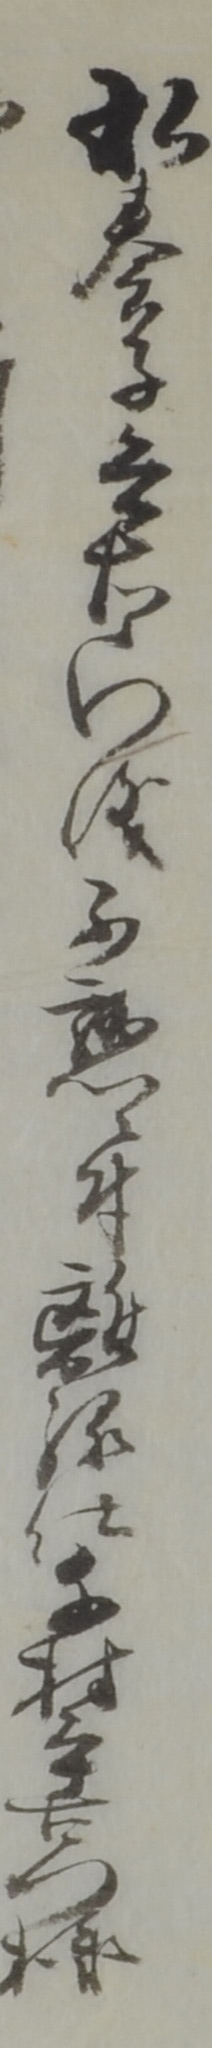私養子兵右衛門儀不熟ニ付離縁仕千村平右衛門様
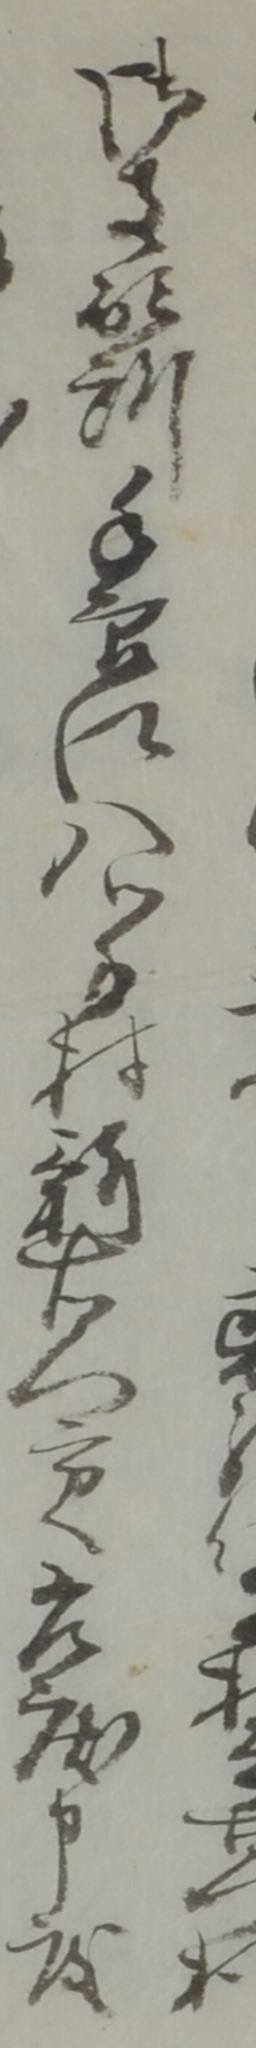御支配所手良郷八ツ手村新右衛門方へ差戻申度
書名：諸願書控簿
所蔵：伊那市立高遠町図書館・合同会社AMANE
